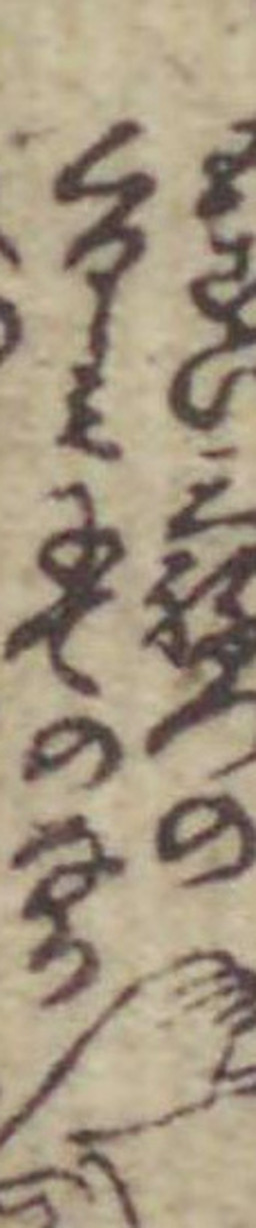くるしみにてのなか
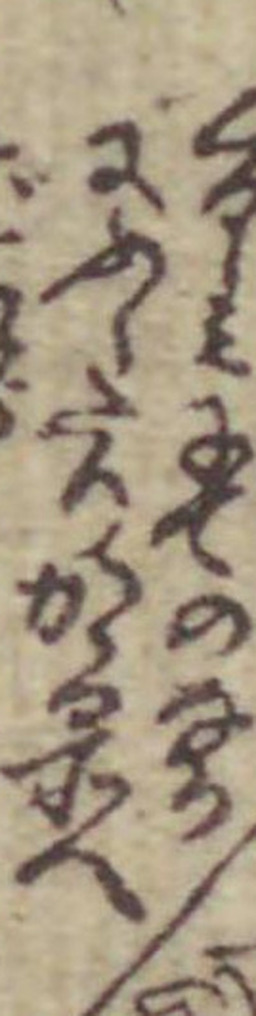にふしたりかゝる所へ
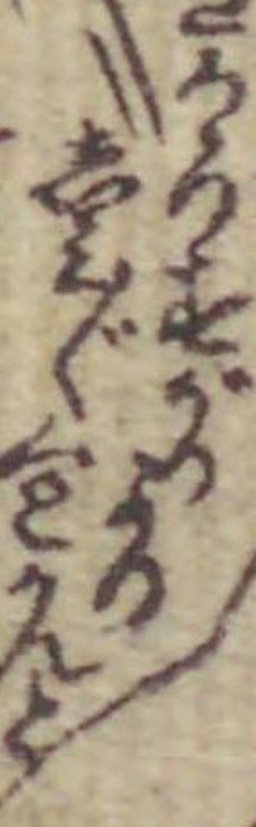しみ〴〵くどかんと
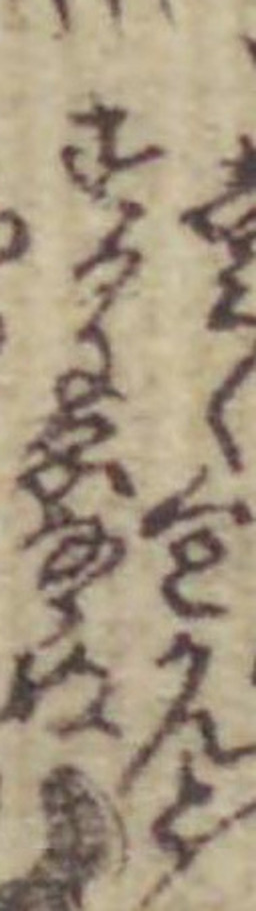するにゑなかぬ
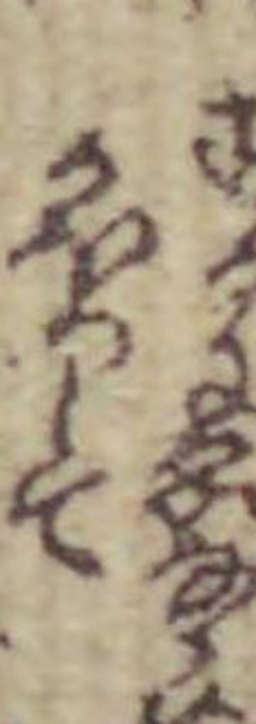かほつして
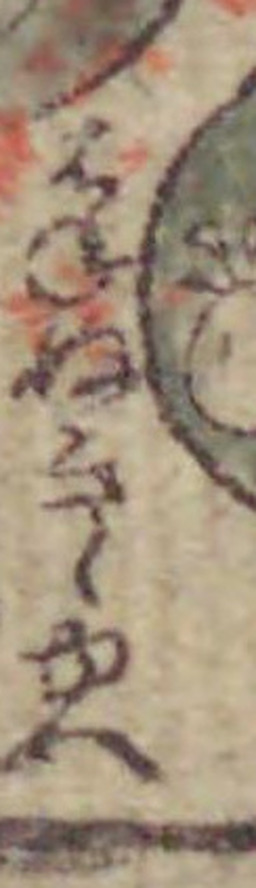はねぬきしゆへ
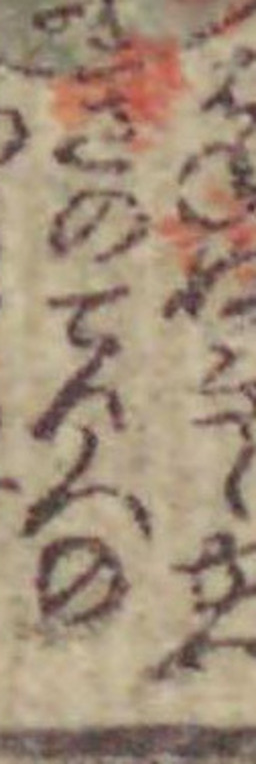さのてん人の
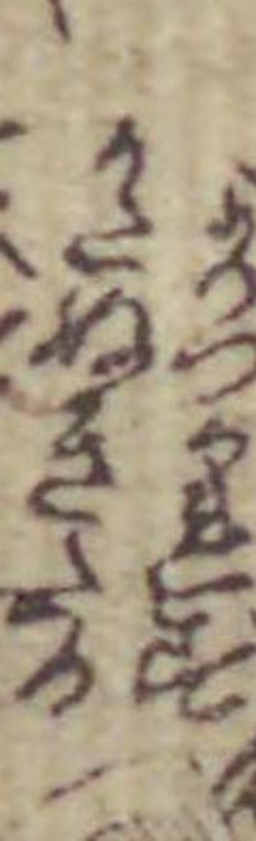かたぬきたる
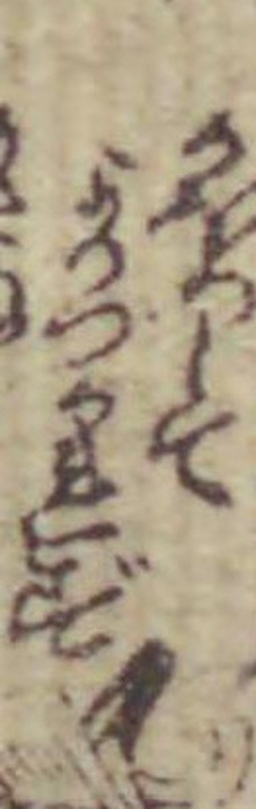よりつけれず
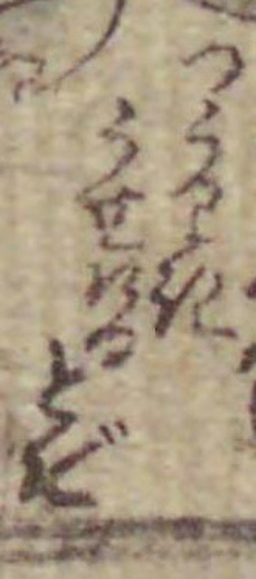うせけるとぞ
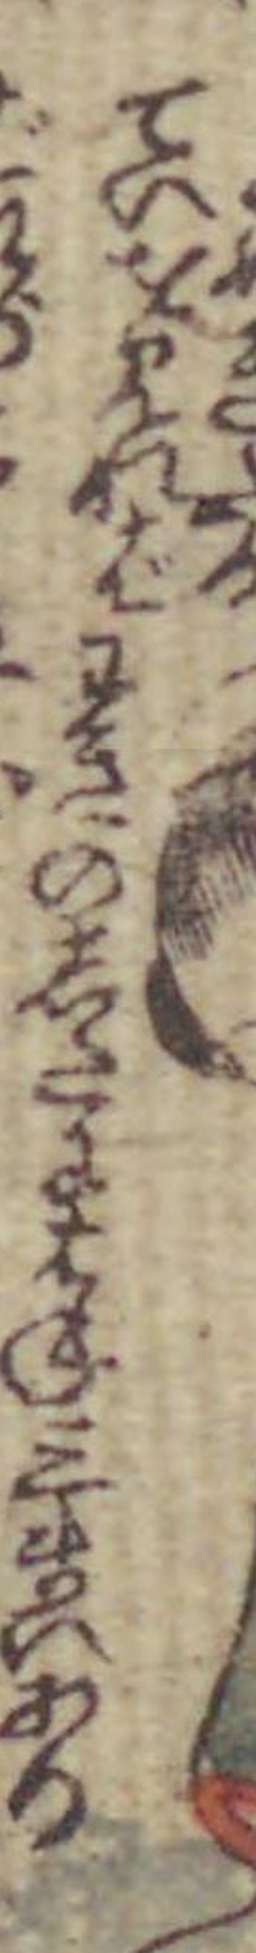ていを見ればわきのしたにはね三まいある
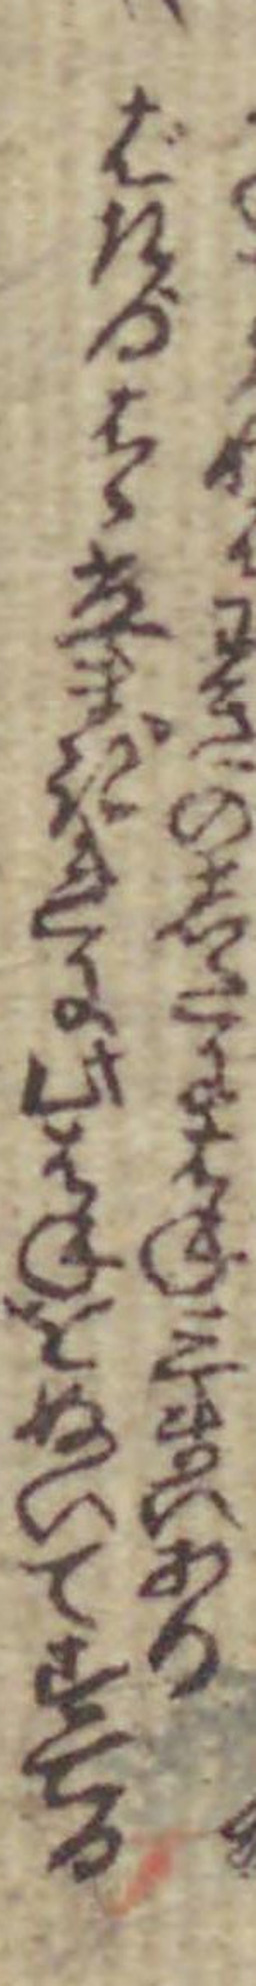ば左衛門はら立まぎれに此はねをぬいてすてる
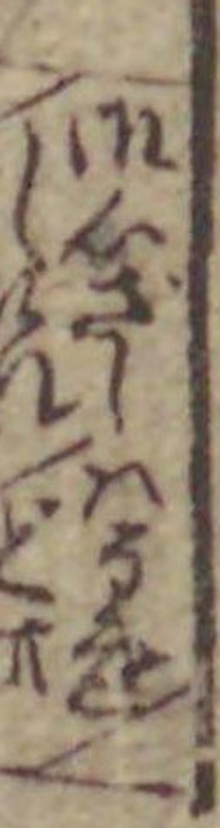御心ざしｈはうれ
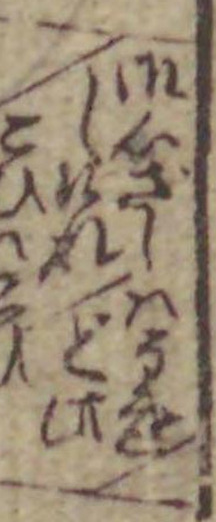御心ざしｈはうれ
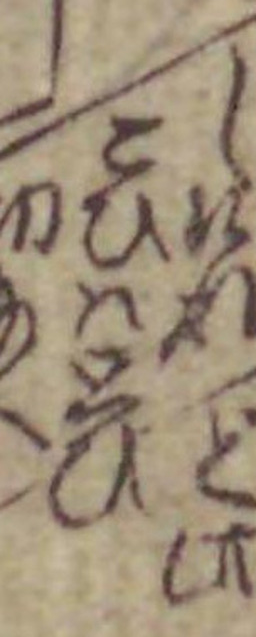こひは思ひ
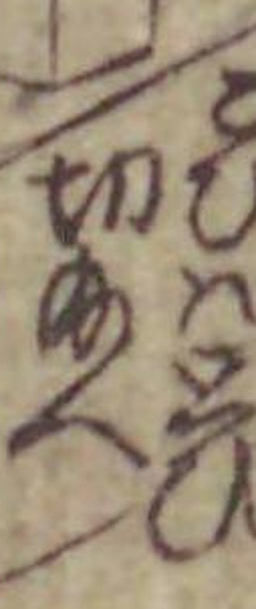切給へ
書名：娜二代鉢木 5巻
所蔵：国立国会図書館 National Diet Library, JAPAN
